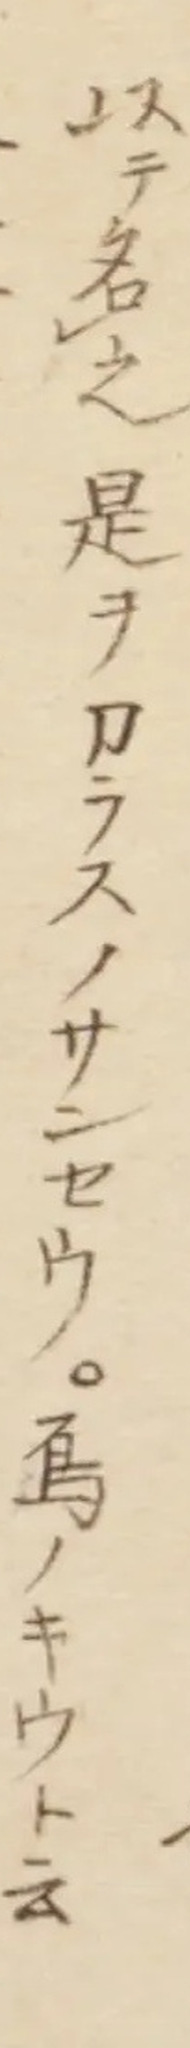以名之是ヲカラスノサンセウ。鳥ノキウト云
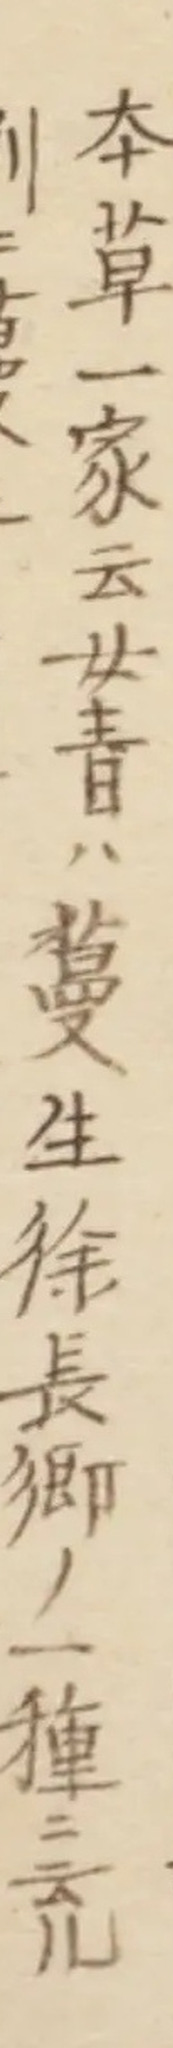本草一家云女青ハ蔓生徐長ノ一種ニ充
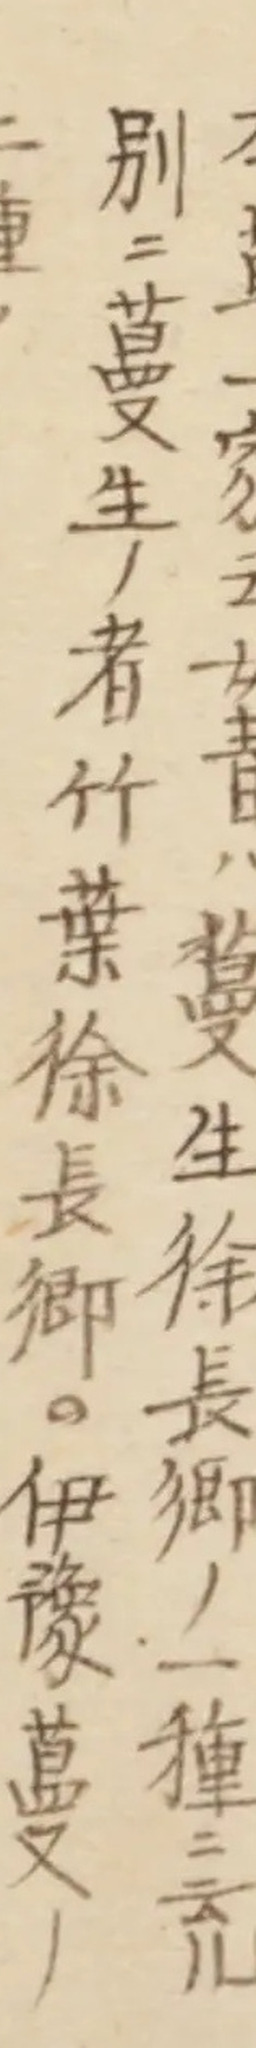別ニ蔓生ノ者竹葉徐長◦伊予蔓ノ
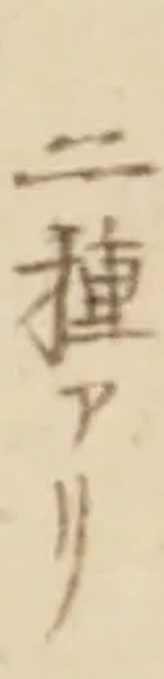二種アリ

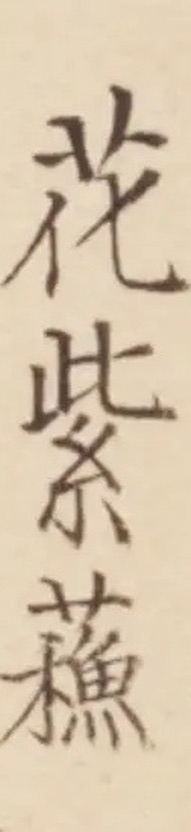花紫蘇
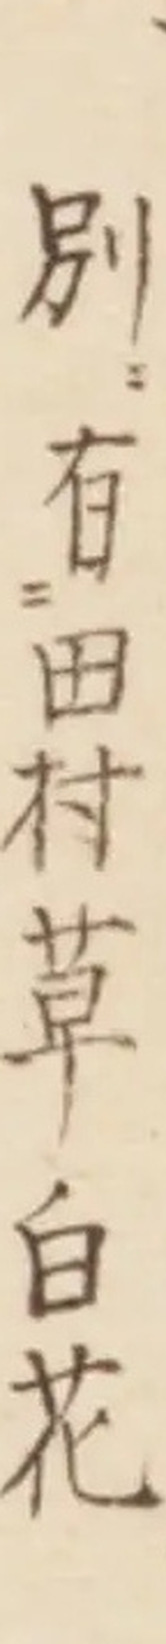別有田村草白花
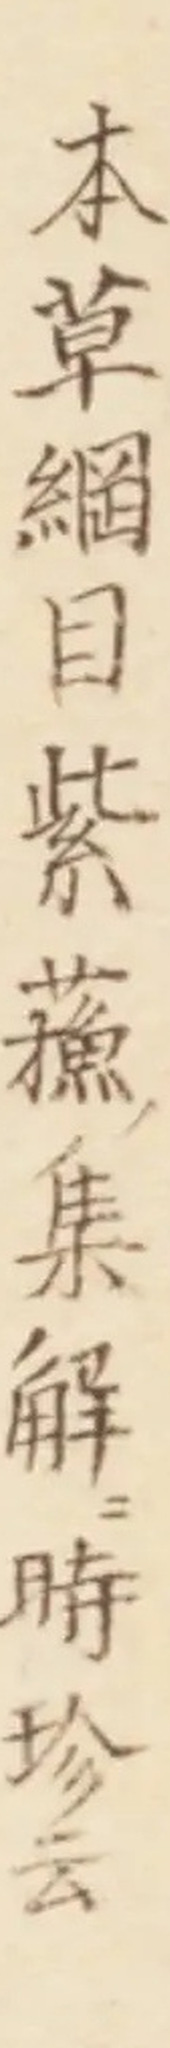本草綱目紫蘇集解時珍云
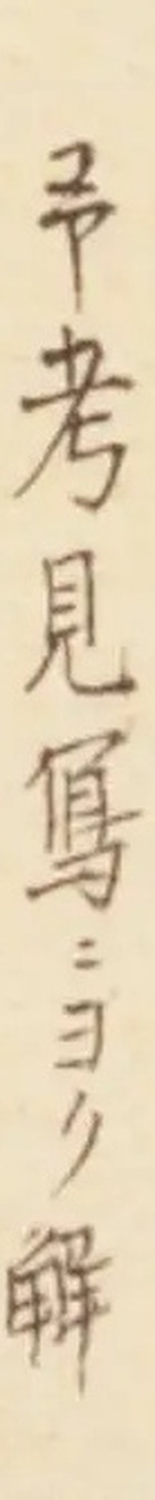予考見写解
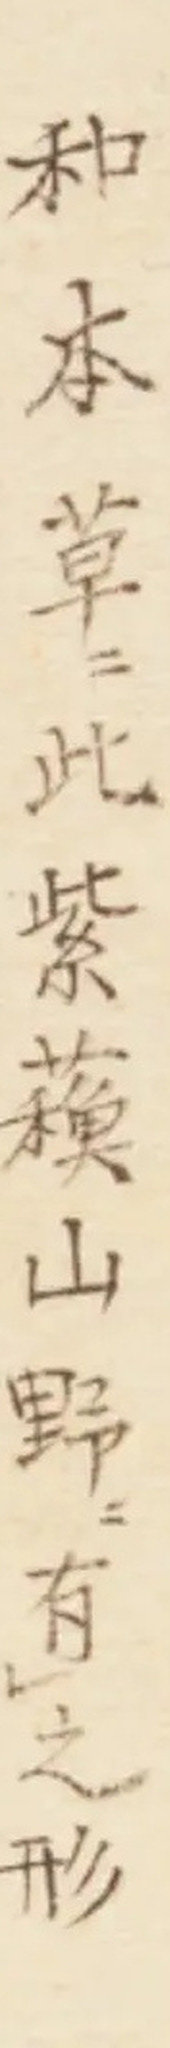和本草此紫蘇山野有之形
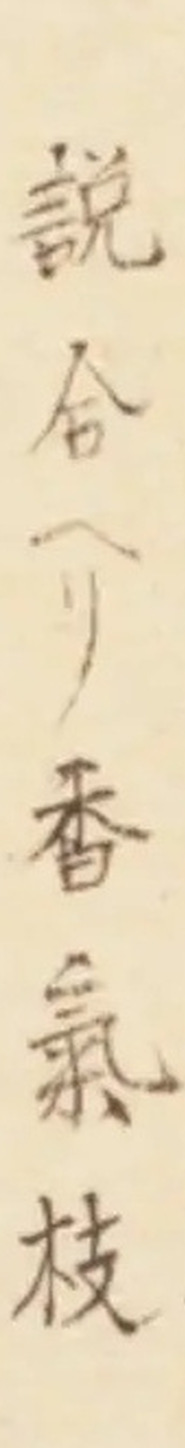説合ヘリ香気枝
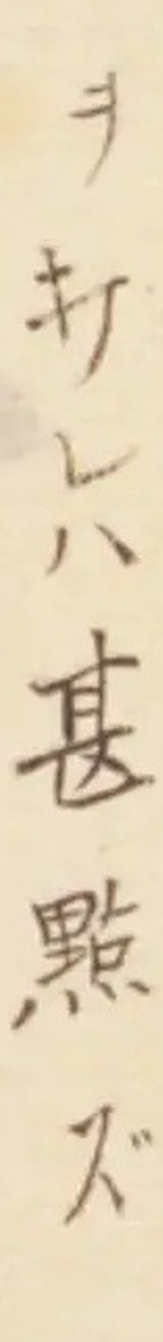ヲ打レハ甚点ズ
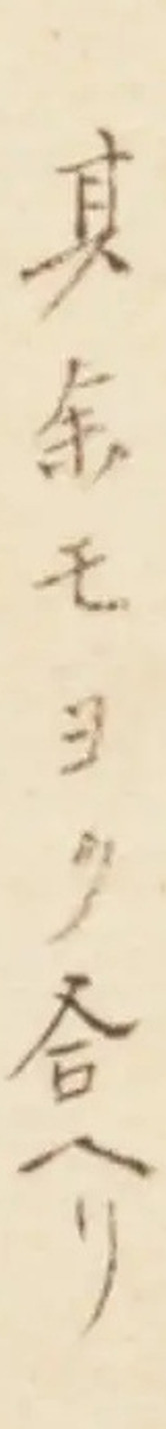其余モヨク合ヘリ
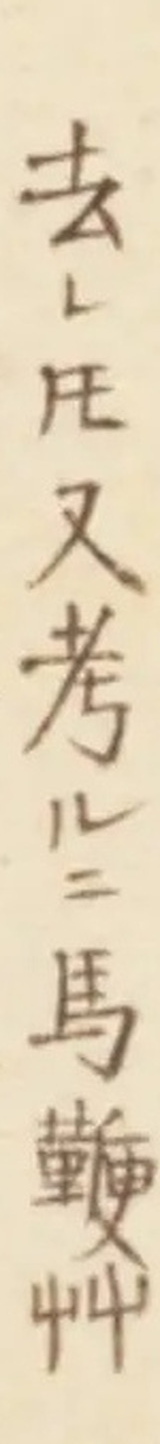去レトモ又考ルニ馬鞭艸
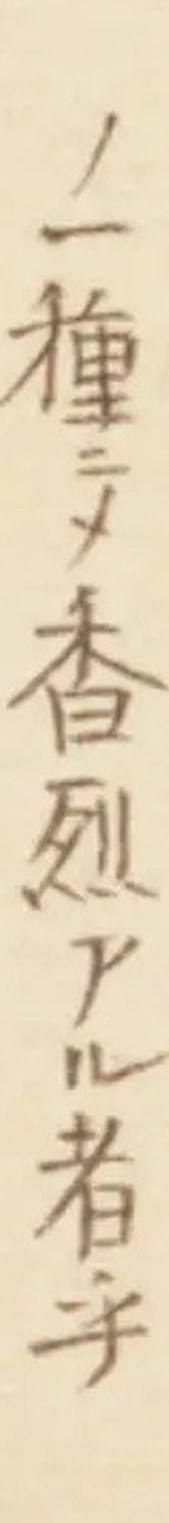ノ一種香烈アル者乎
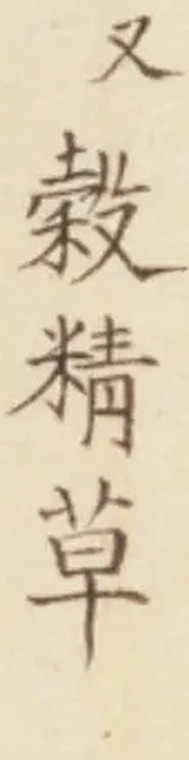穀精草
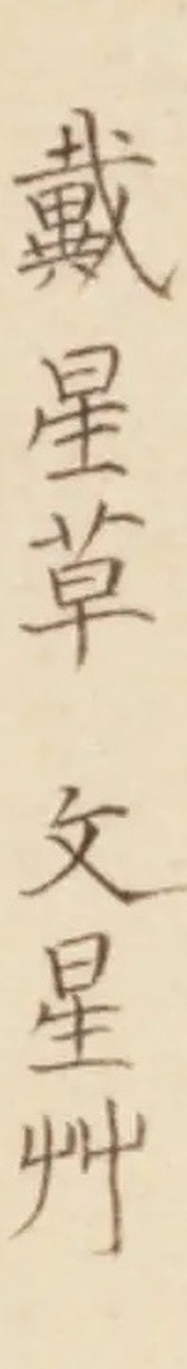戴星草文星艸
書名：梅園草木花譜秋之部. 2
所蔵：国立国会図書館 National Diet Library, JAPAN
